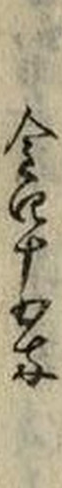金四十五両
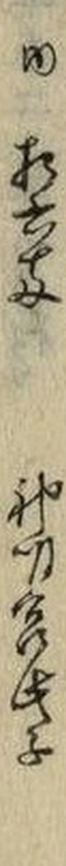内拾六両神明宮氏子
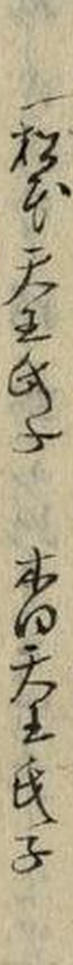松本天王氏子木田天王氏子
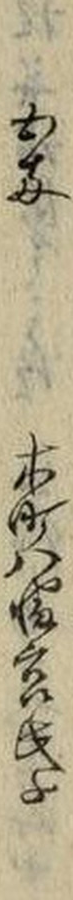五両木町八幡宮氏子
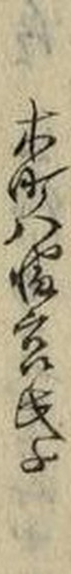五両木町八幡宮氏子
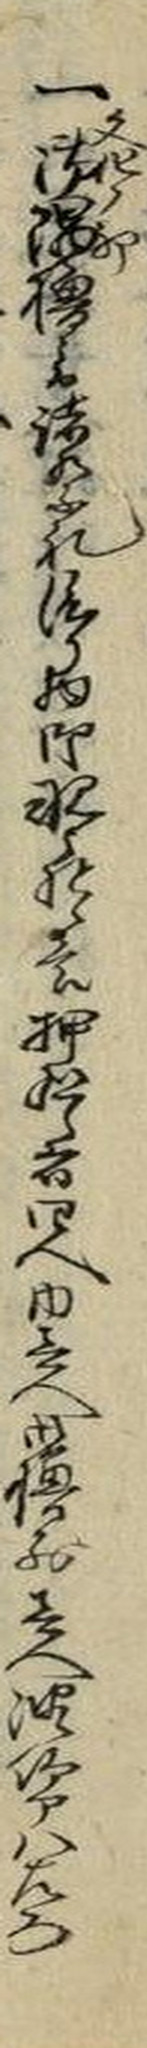一御隅櫓にて御祭礼渡り物御覗被遊候節押組之者四人内壱人御櫓前壱人波々伯部八左衛門
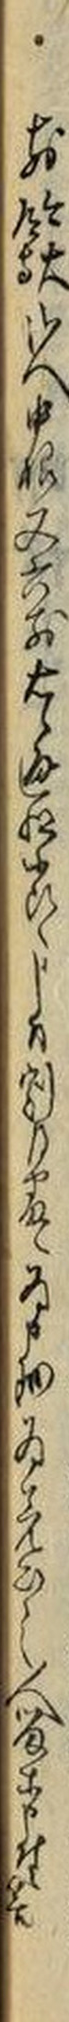前今大道寺弐人中根又六前右之通組小頭へ申付割月番へ為申越為差出之人留等申付候筈
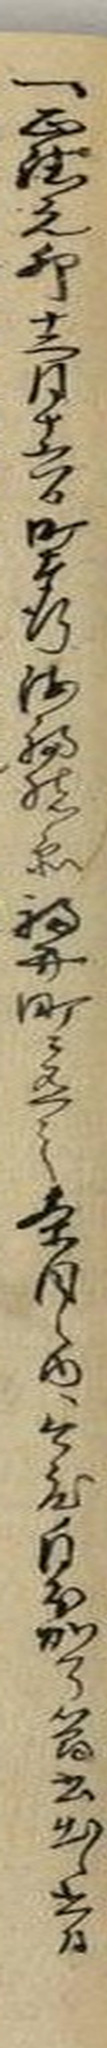一正徳元卯十二月十六日町奉行海福猪兵衛福井町に有之条目之内へ今度自分加了簡書出候書付
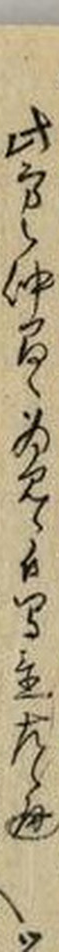此方之仲間へ為見候付写置左之通覚
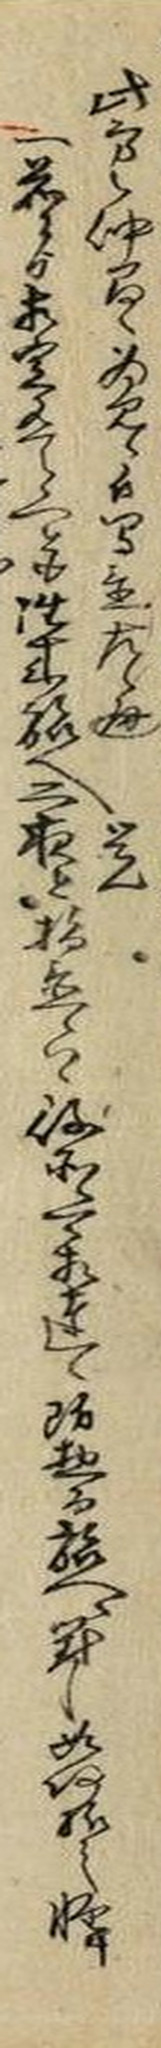一前々ゟ相定有之候へとも往来旅人二夜と指置候はゝ役所へ可相達候附惣て旅人へ対し如何様之軽キ
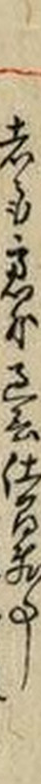者にも慮外過言仕間敷事
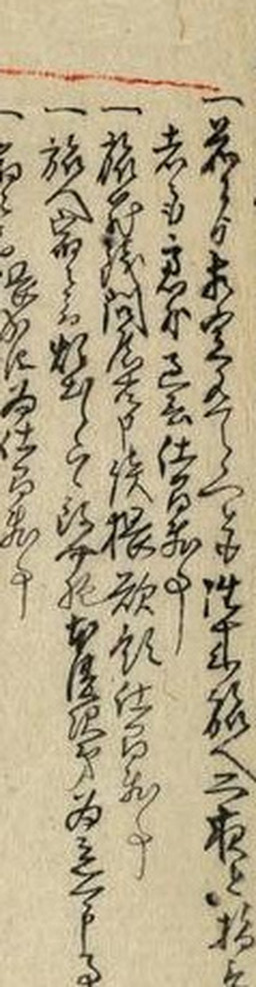一旅籠銭問屋共申談猥歎願仕間敷事
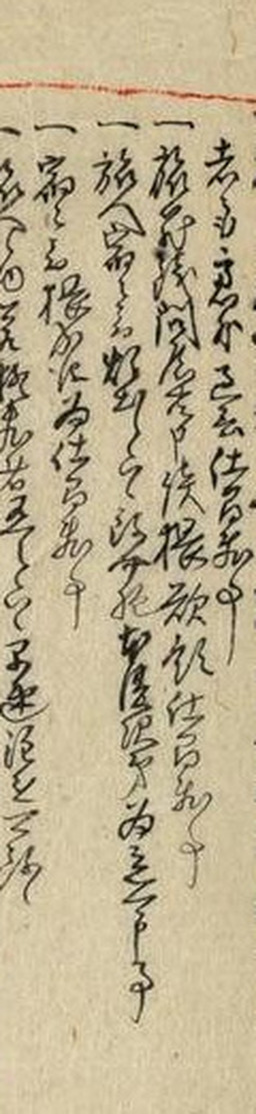一旅人宿々にて煩出候はゝ致介抱本復次第為立可申事
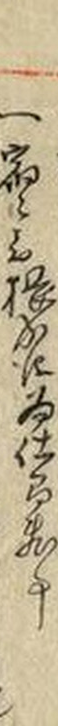一宿々にて猥成儀為仕間敷事
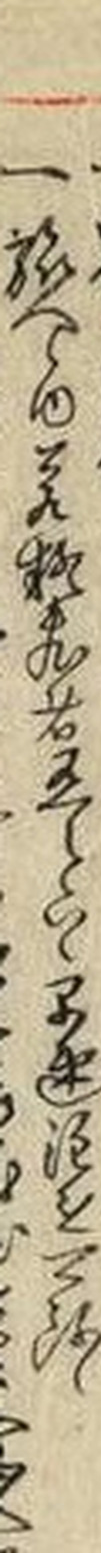一旅人之内若疑敷者有之候はゝ早速注進可致候
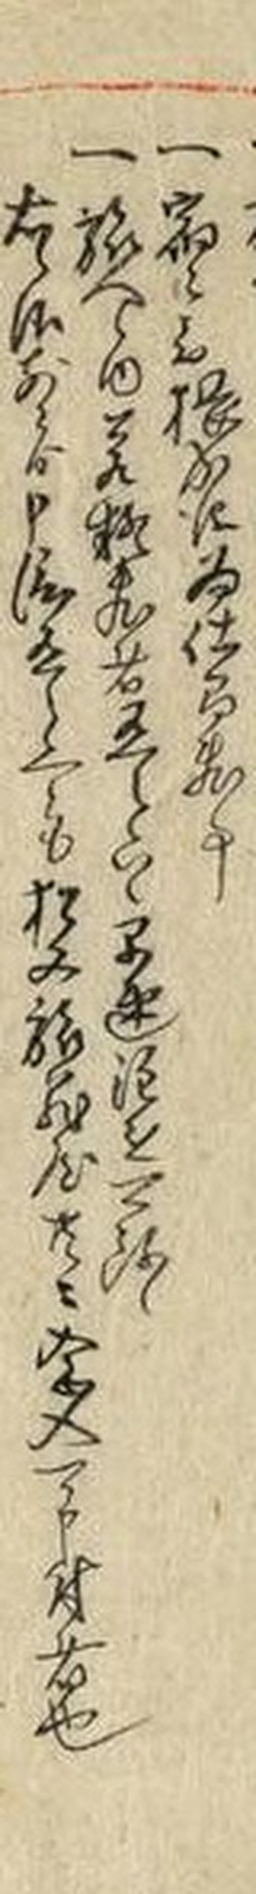右之趣前々ゟ申渡有之候へとも猶又旅籠屋共に念入可申付者也
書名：御城下諸事之部
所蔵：福井県文書館 Fukui Prefectural Archives
